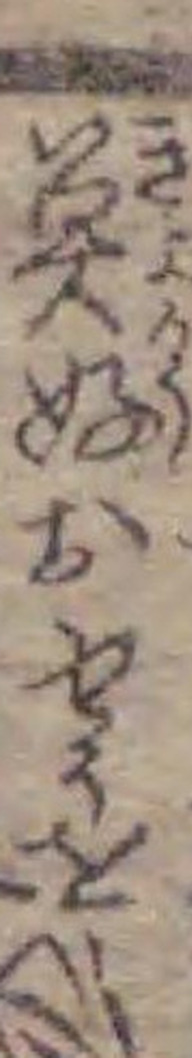魚好おせうを
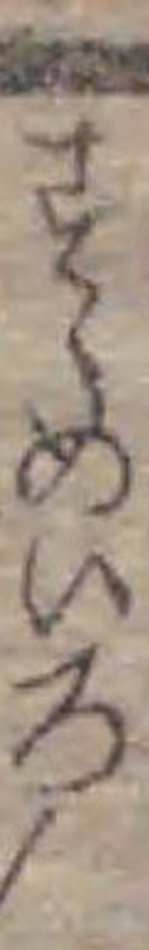すゝめいろ
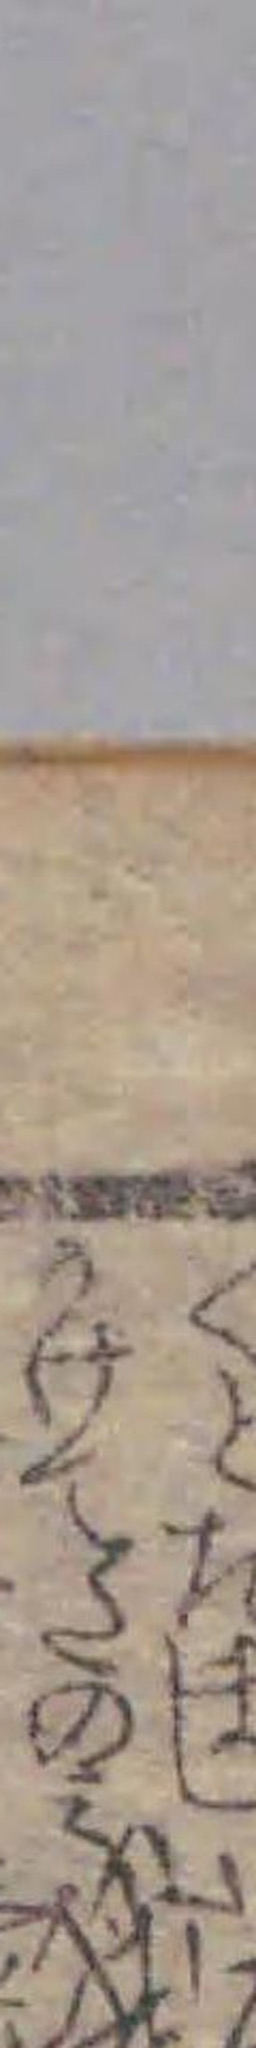うけてたのみ
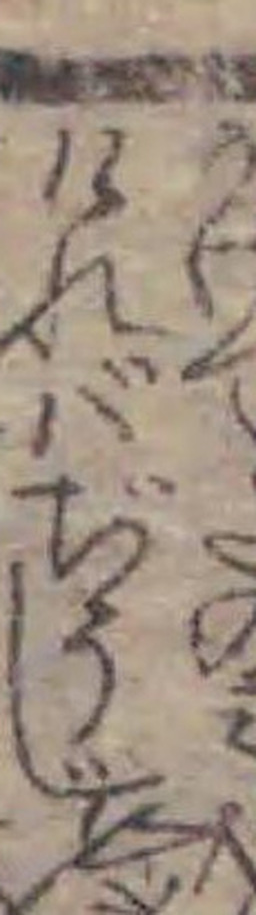ければぢうじ
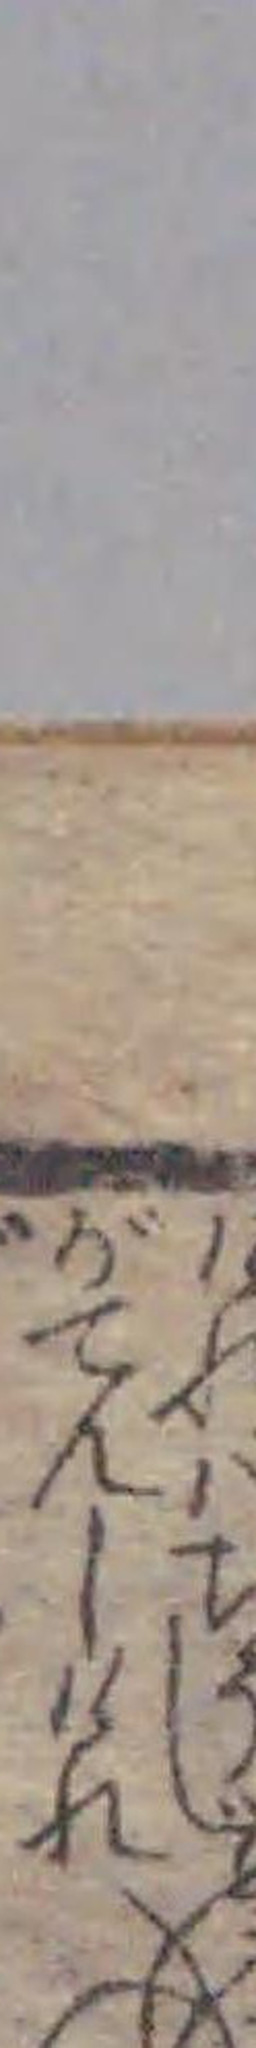がてんしけれ
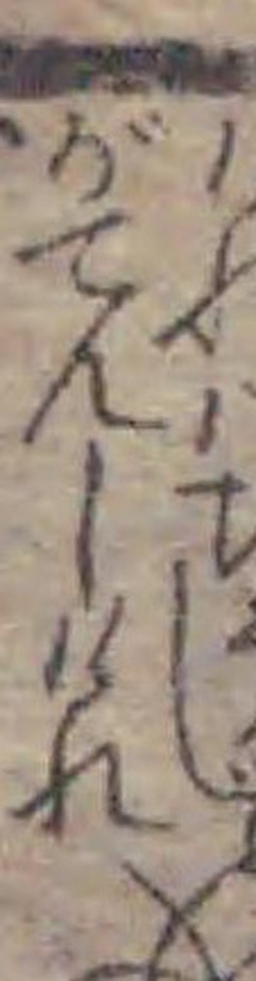がてんしけれ
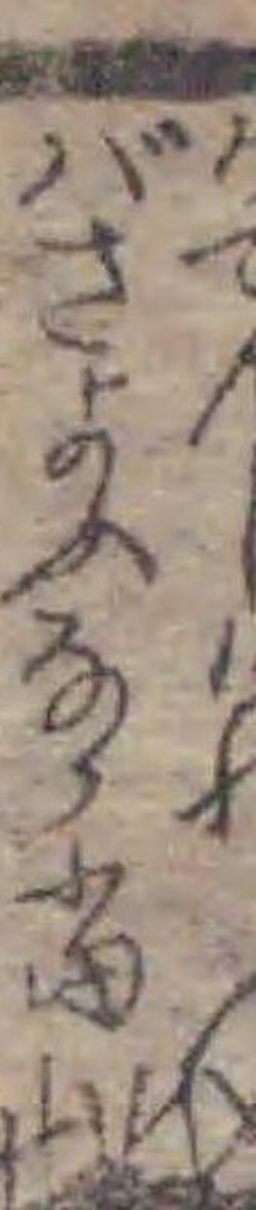ばさよふなら当
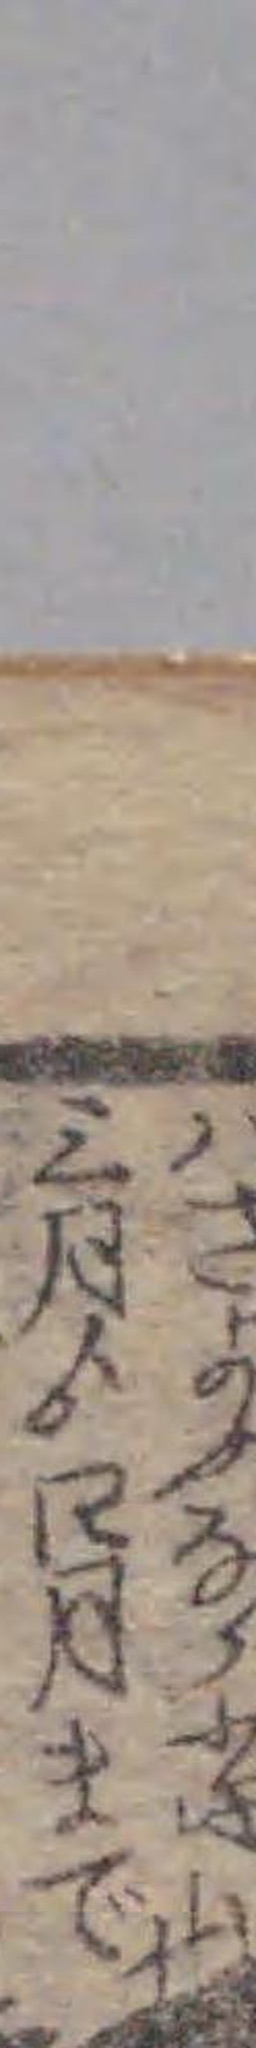三月より四月まで
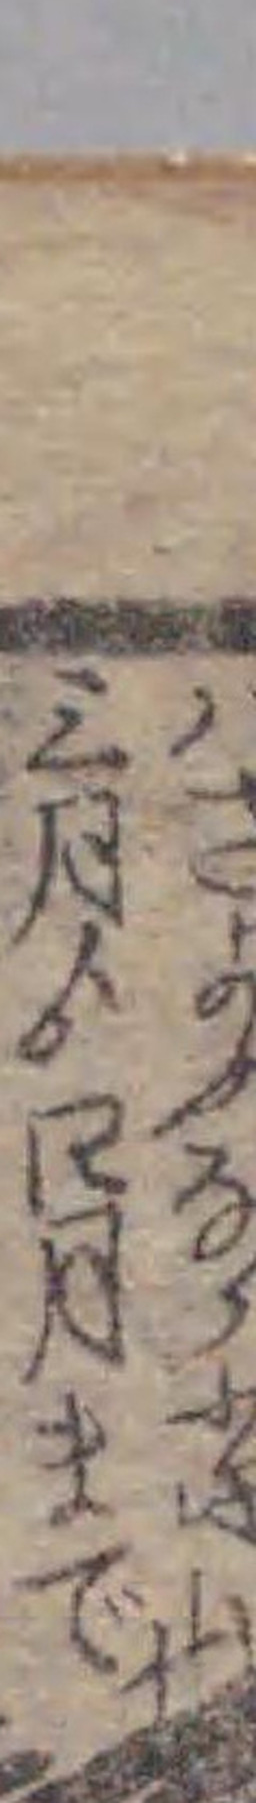三月より四月まで
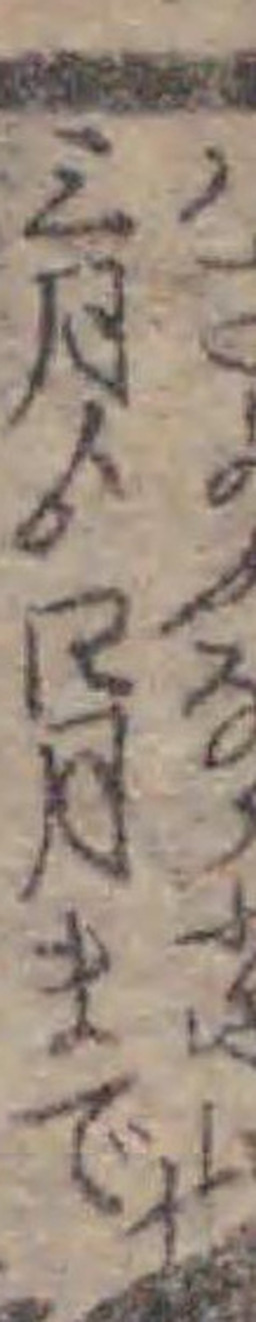三月より四月まで
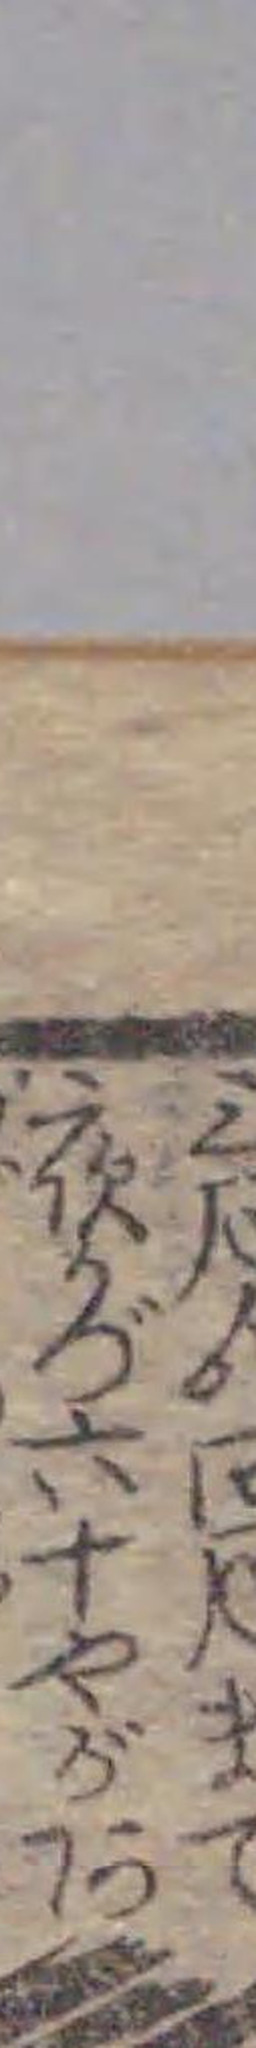夜かづ六十やがあ
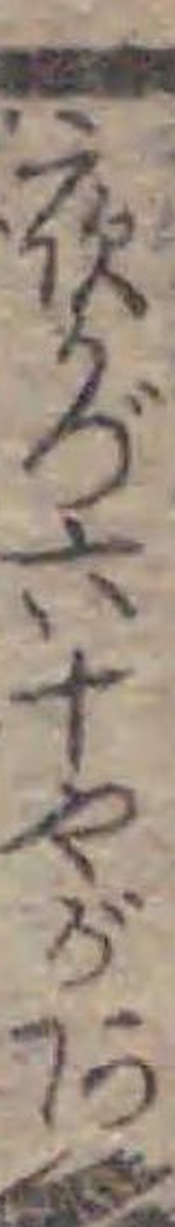夜かづ六十やがあ
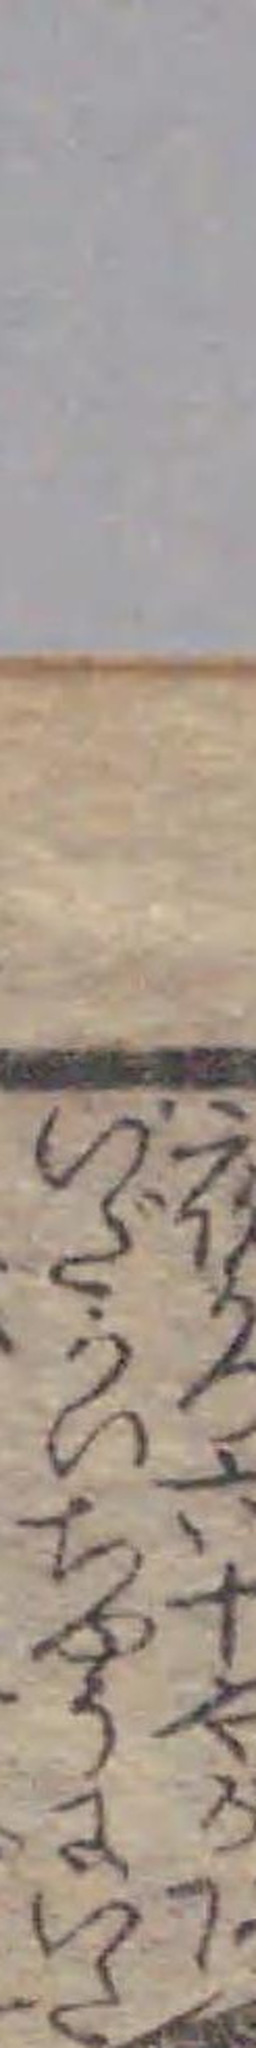いだかいちやうにいた
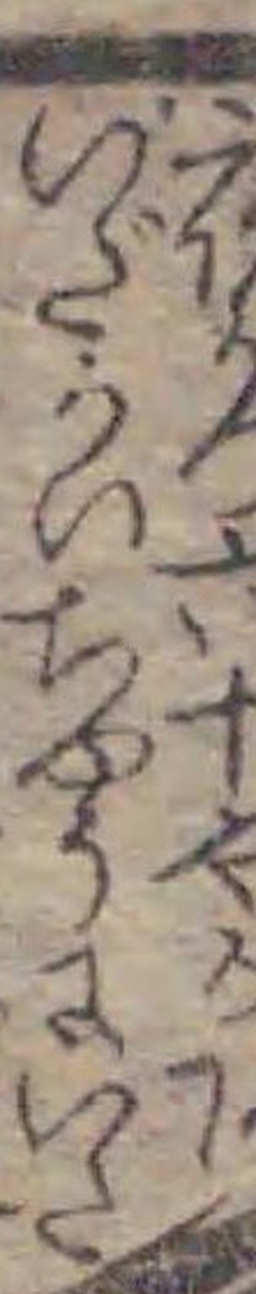いだかいちやうにいた
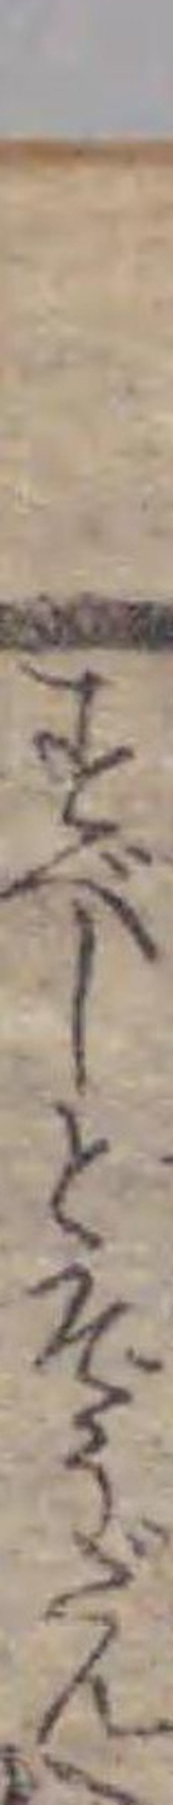すべしとそうだん
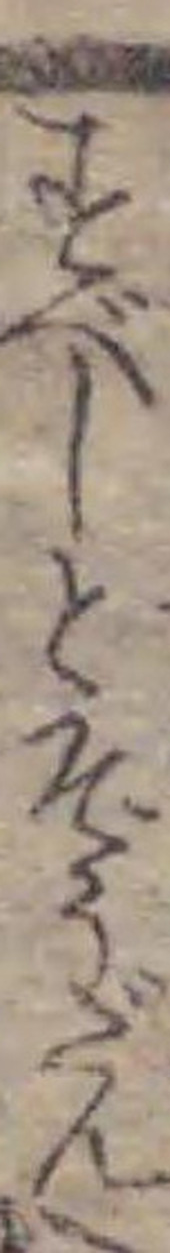すべしとそうだん
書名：化物七段目 : 2巻
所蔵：国立国会図書館 National Diet Library, JAPAN
